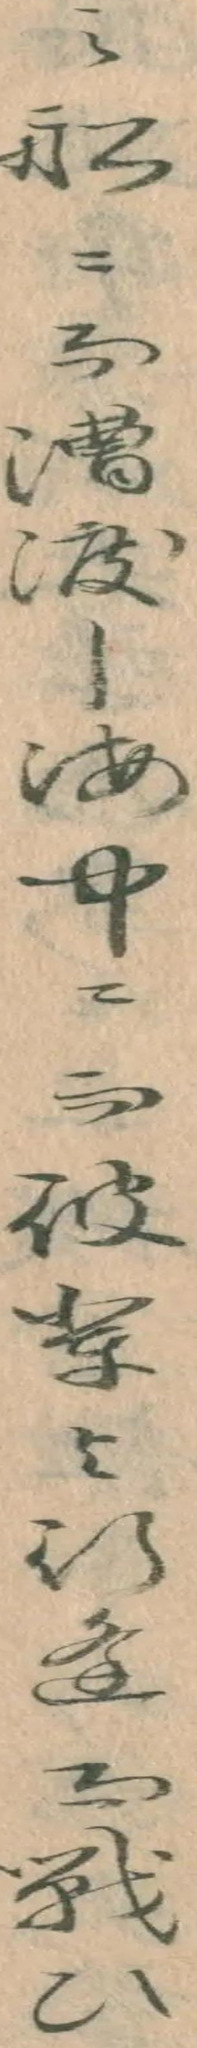之舩に而漕渡し海中に而彼輩与行逢而戦ひ
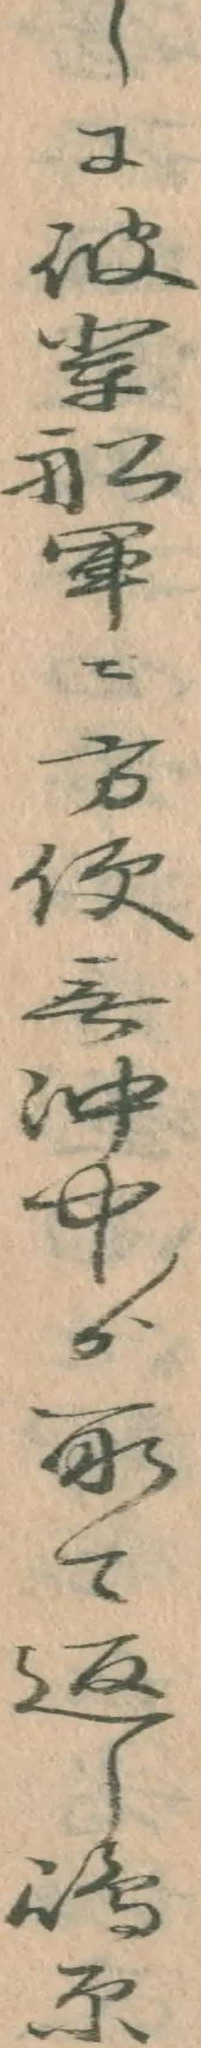し尓彼輩舩軍に方便無沖中ゟ取て返し島原
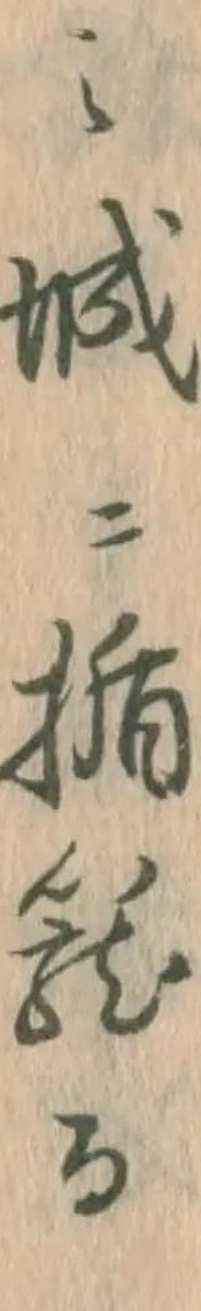之城に楯籠る
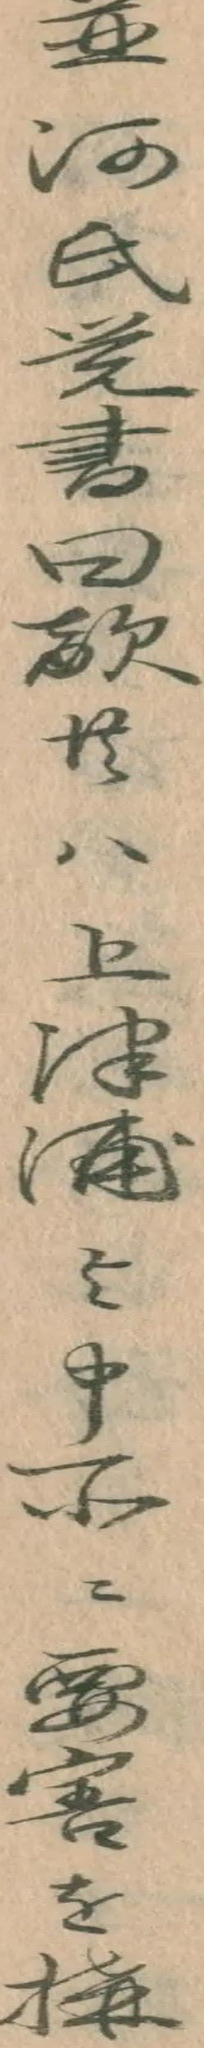並河氏覚書曰敵共は上津浦与申所に要害を構
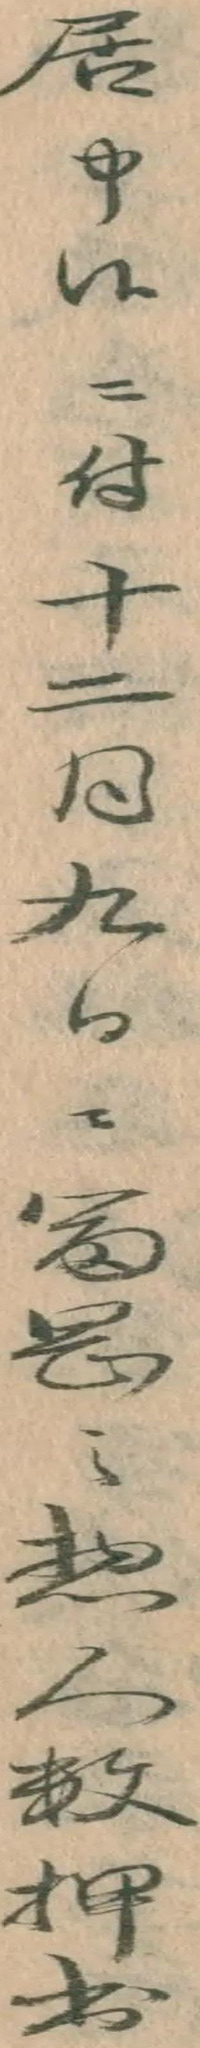居申候に付十二月九日に冨岡之惣人数押出
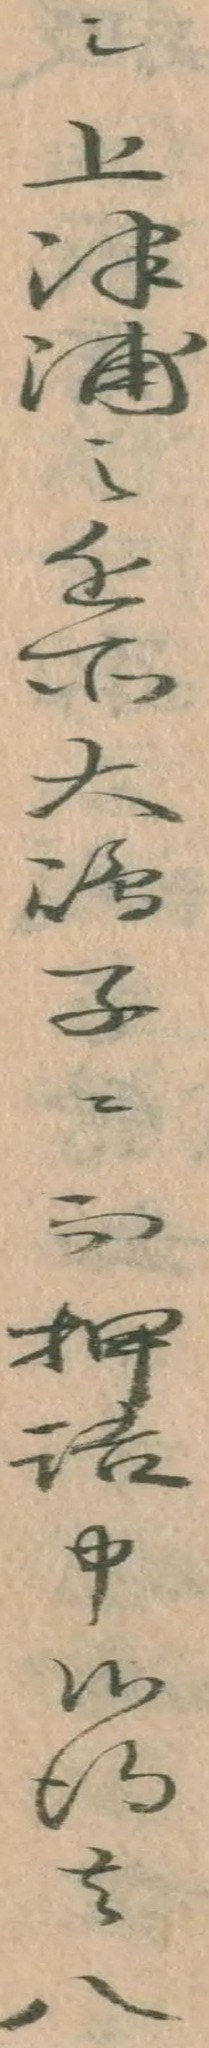し上津浦之近所大島子に而押詰申候得者八
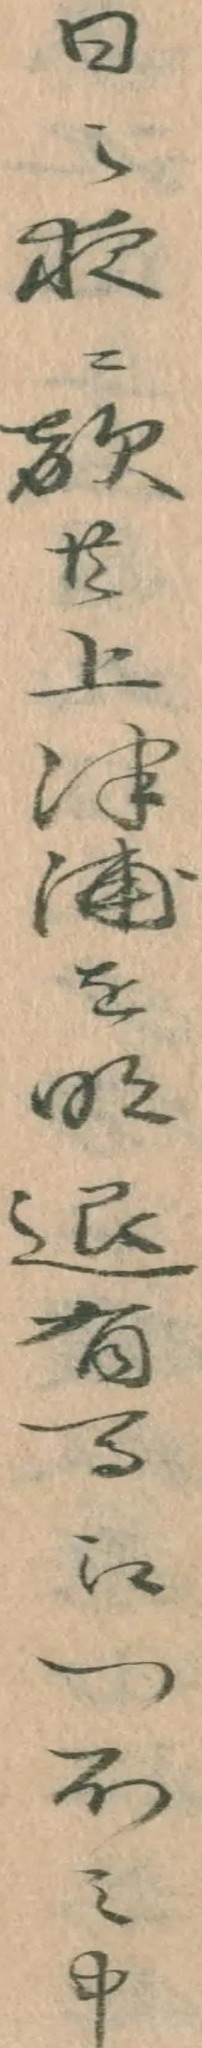日之夜に敵共上津浦を明退有馬江つ不之申
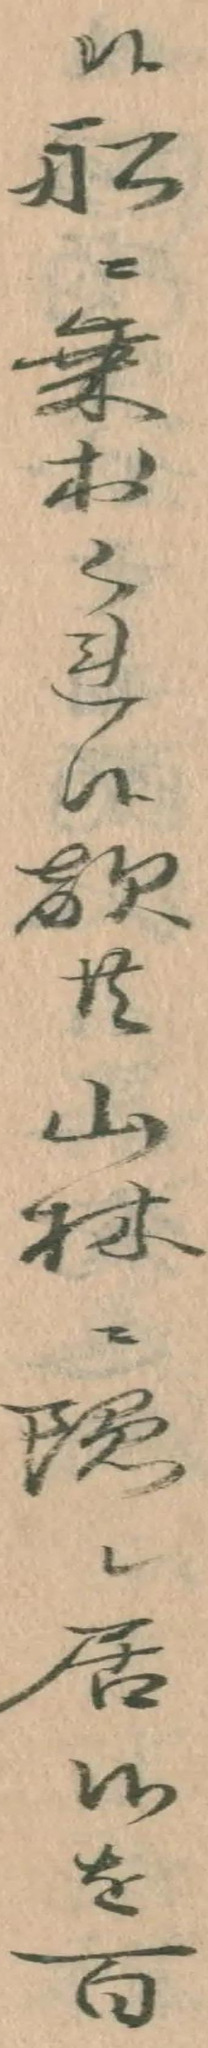候舩に乗おく連候敵共山林に隠し居候を百
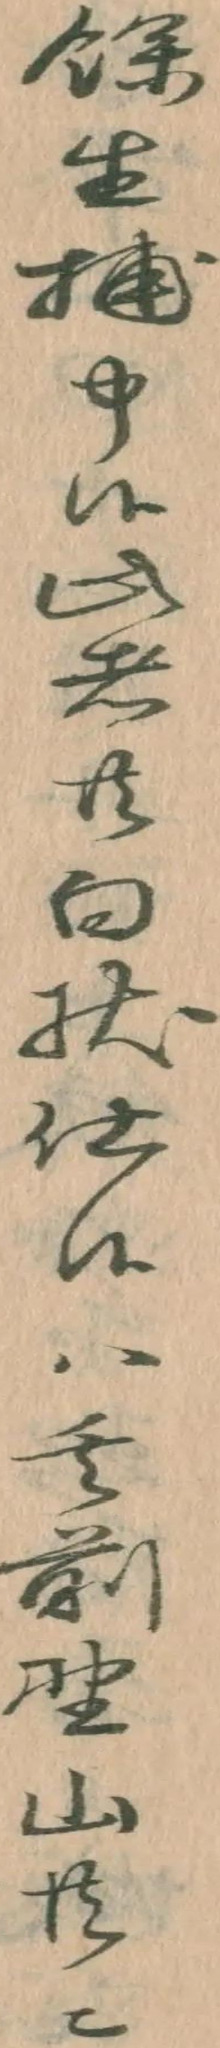余生捕申候此者共白状仕候は其前野山共に
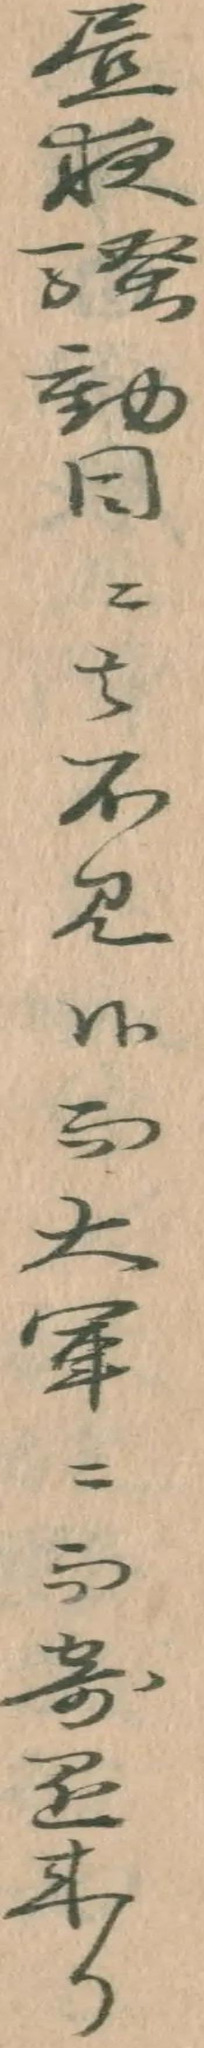昼夜騒動目に者不見候而大軍に而寄懸来り
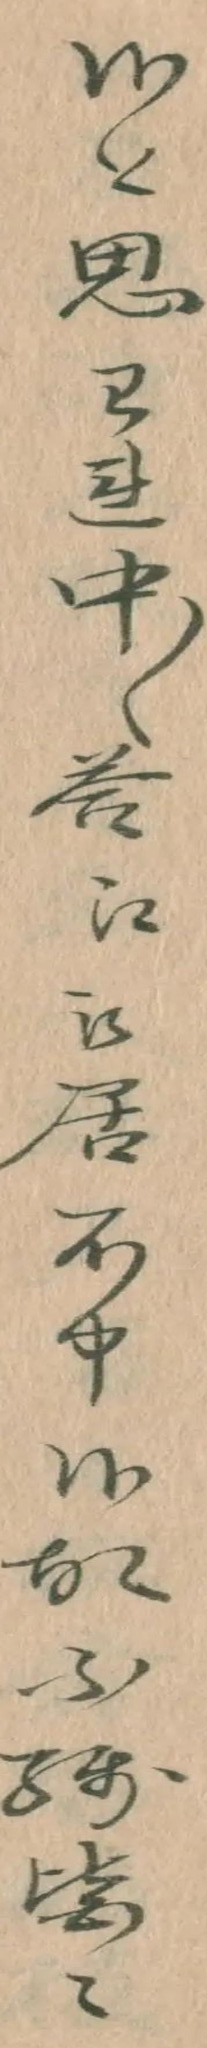候と思已連中々答江被居不申候故ふ残皆々
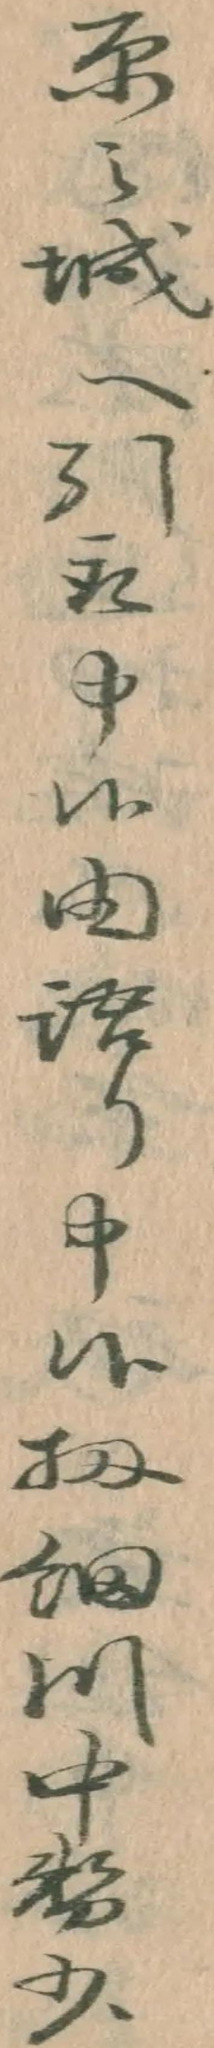原之城へ引取申候由語り申候扨細川中務少
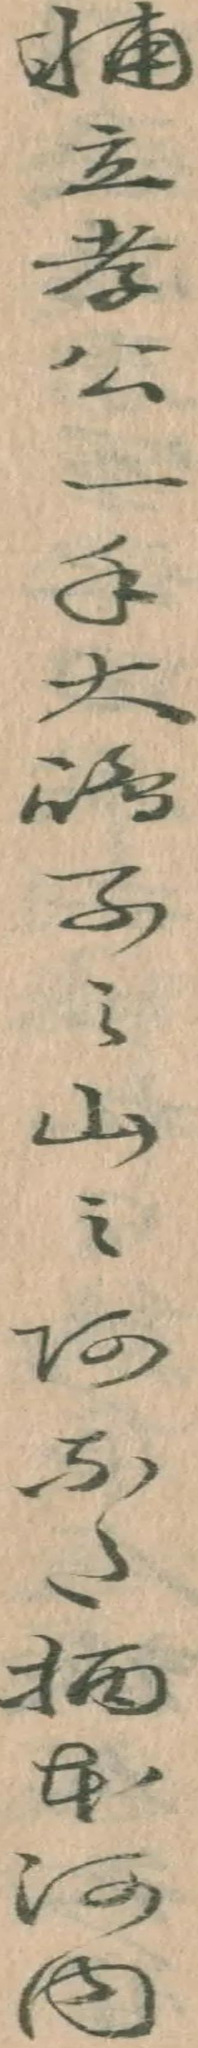輔立孝公一手大島子之山之阿なた栖本河内
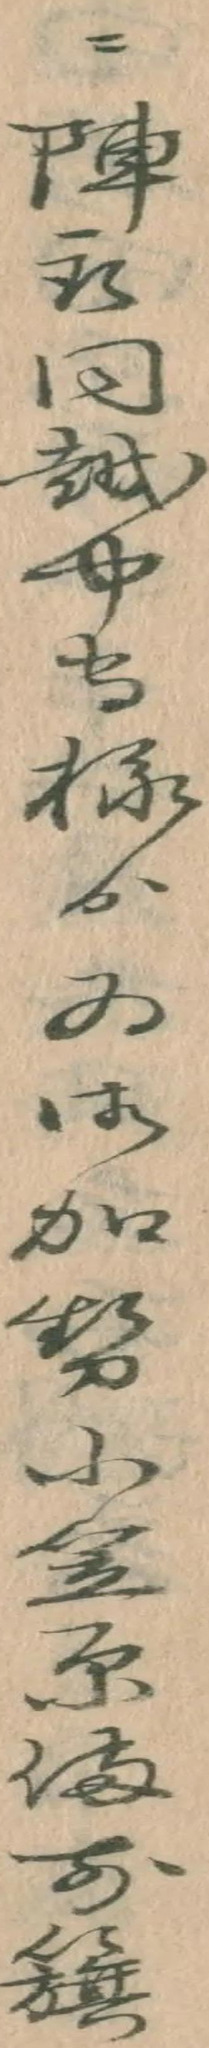に陣取同越中守様ゟゐ御加勢小笠原備前籏
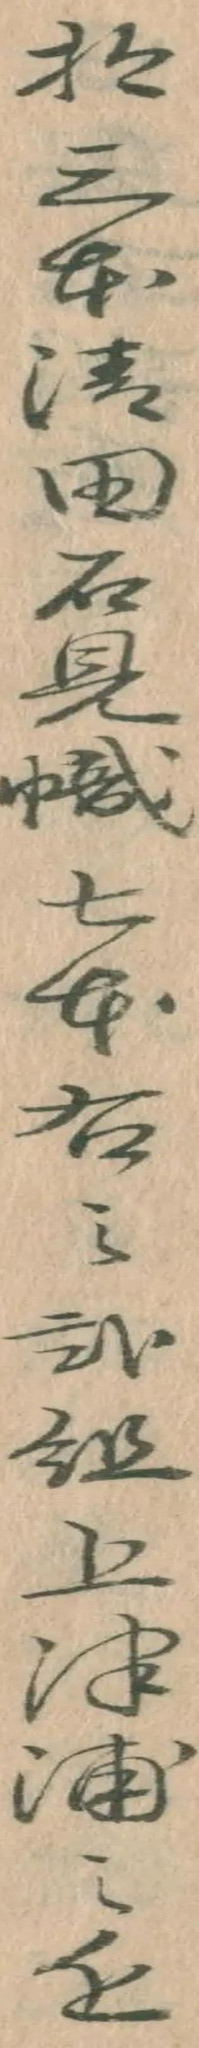拾三本清田石見幟七本右之弐組上津浦之近
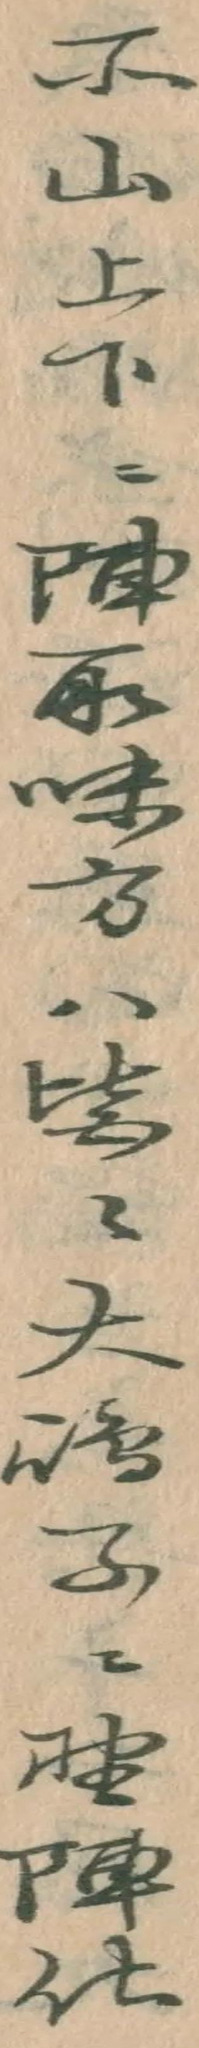所山上下に陣取味方は皆々大島子に野陣仕
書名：切支丹御退治記 49巻. [4]
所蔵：国立国会図書館 National Diet Library, JAPAN
